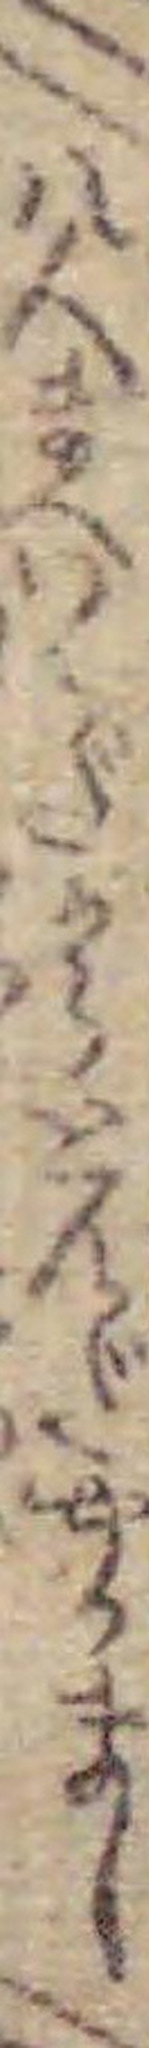八人まへつゝだからとんだやかまし
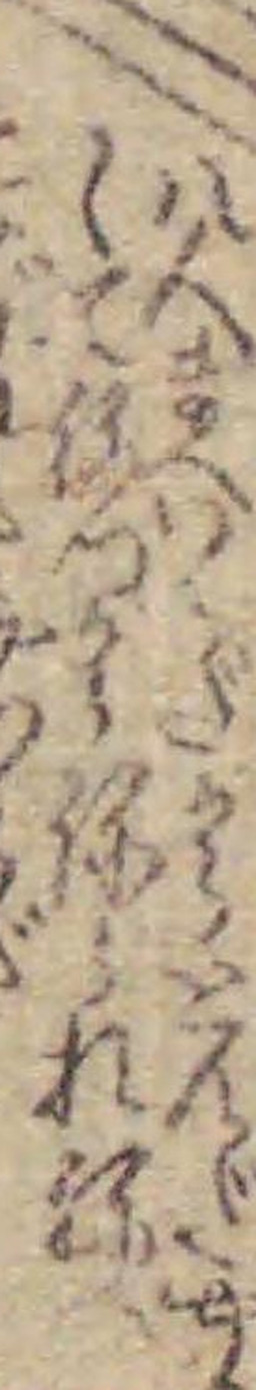くてねつからねられねへ
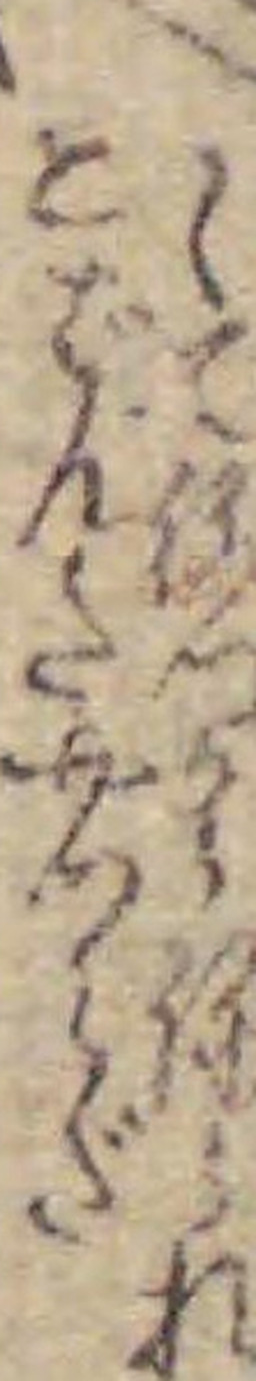こばんたやつらだ
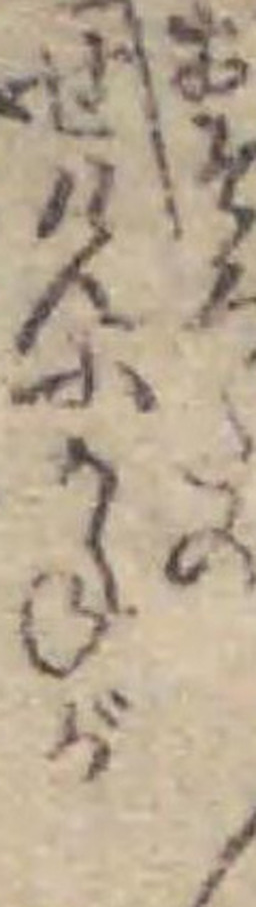〽せけんにかねが
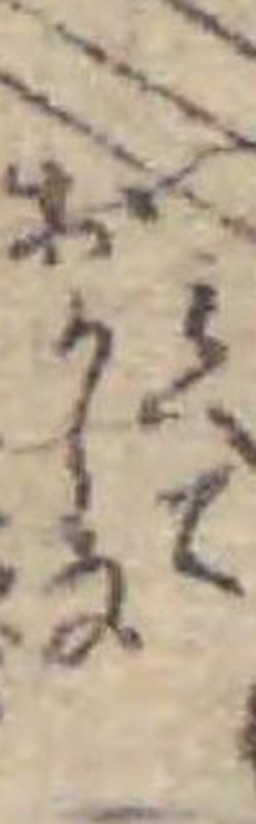おかしな
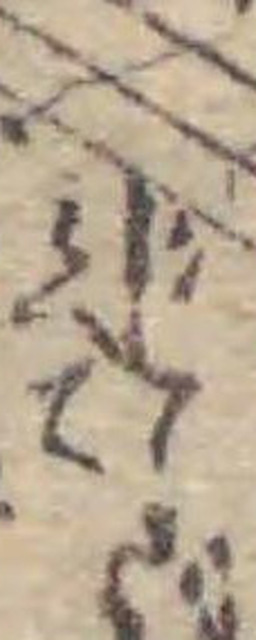みへて
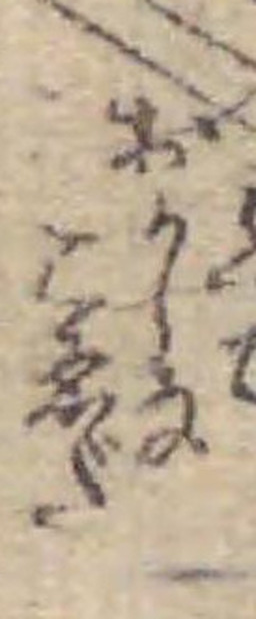こゑだ
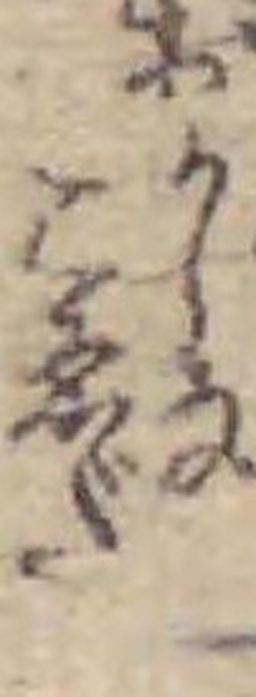こゑだ
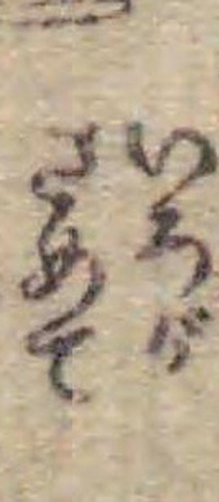さめて
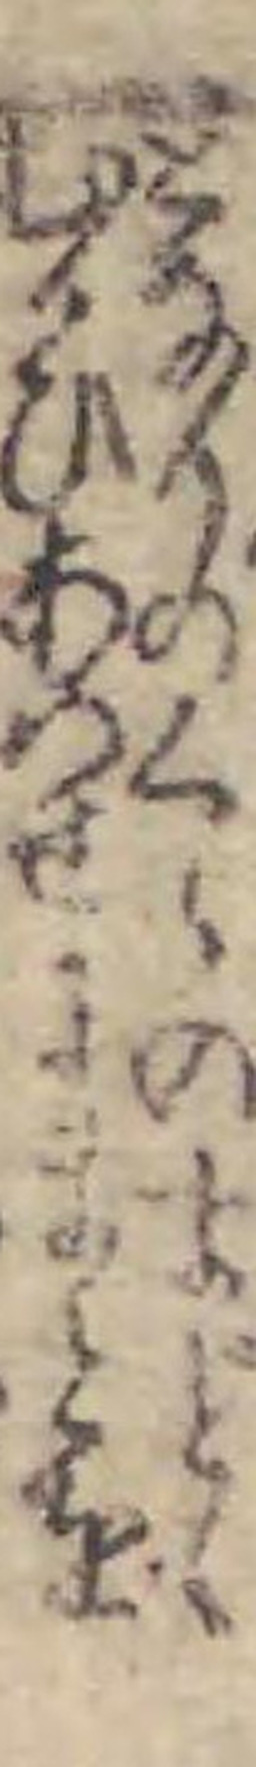むかひあはせにまとを
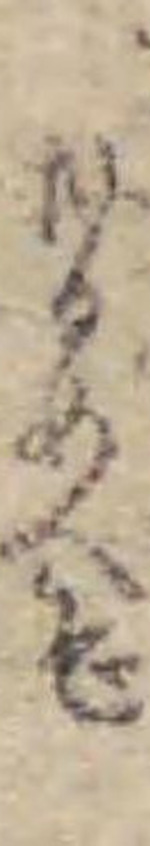おるめへぞ
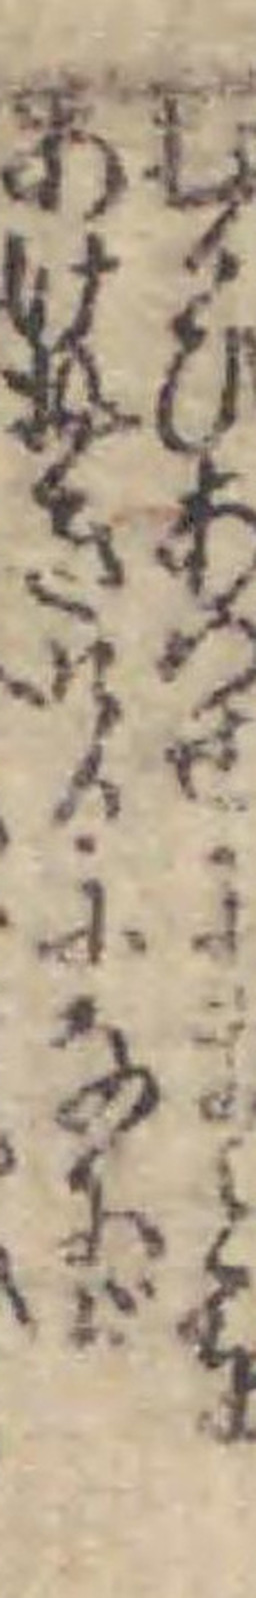あけおきけるになに
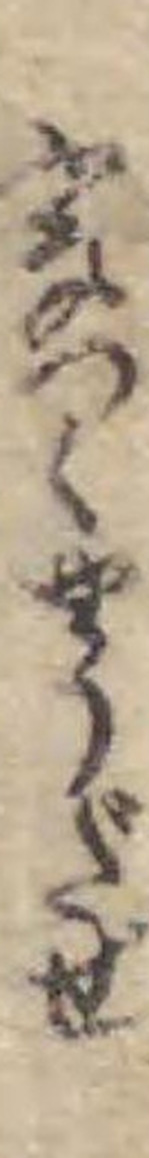ふなつくやろうだぜ
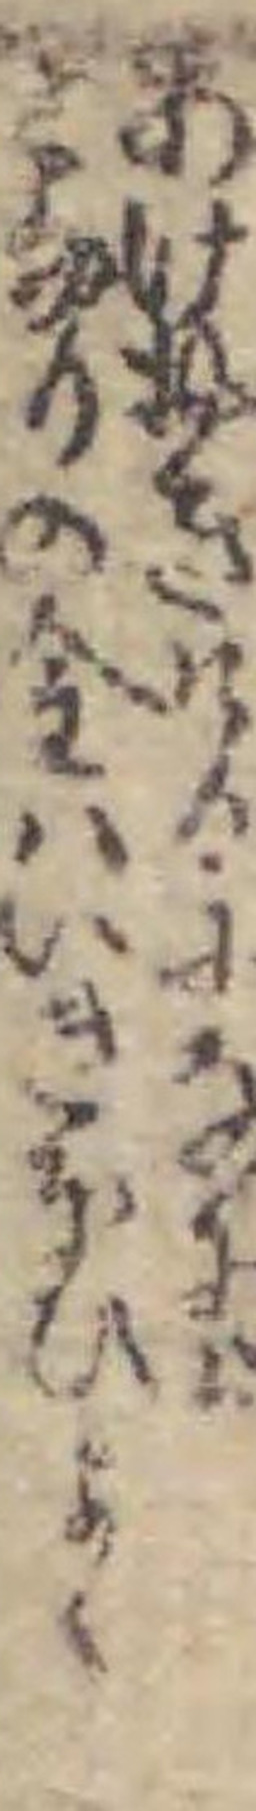となりの金はいきほひよく
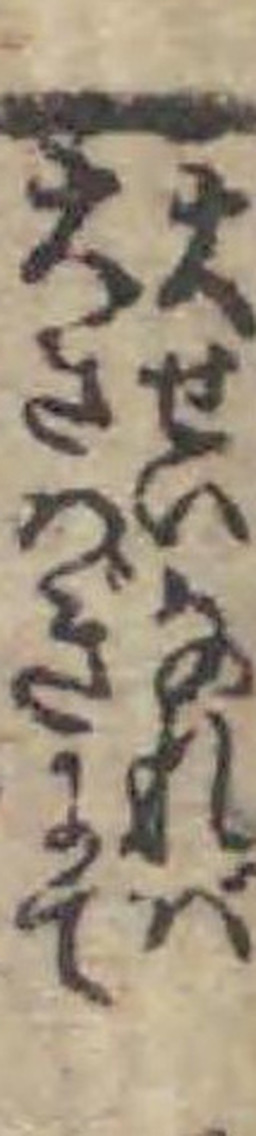大さはぎにて
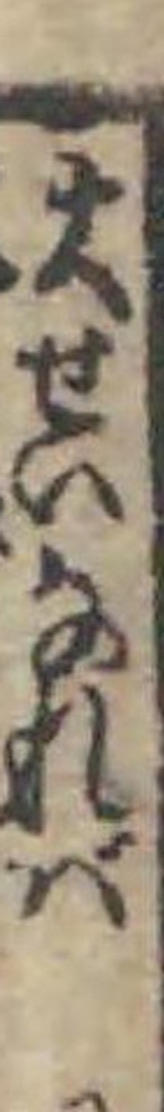大せいなれば
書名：新鋳小判 : 3巻
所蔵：国立国会図書館 National Diet Library, JAPAN
